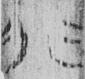行
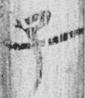子
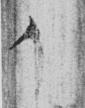人
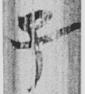子
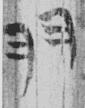羽
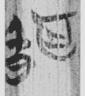䎽（問）
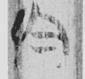於
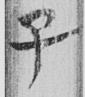子
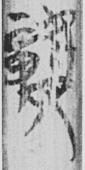贛（貢）
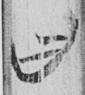曰
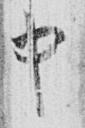仲
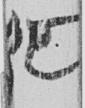○（尼）
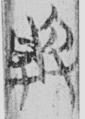與
